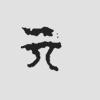亓（其）
